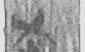五
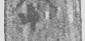十
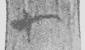七
